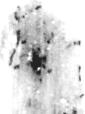閟（閉）
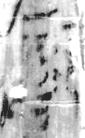啟
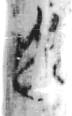朝
